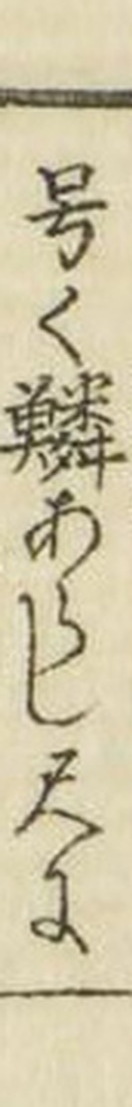号く鱗あらし尺に
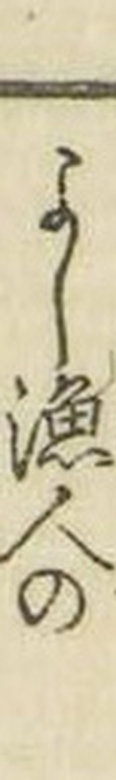よし漁人の
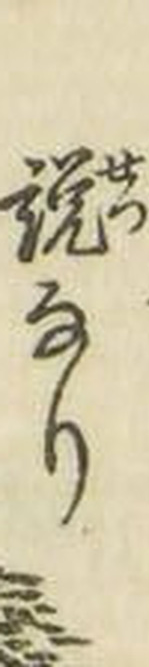説なり

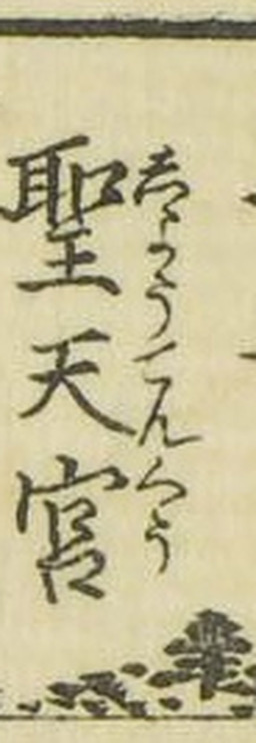聖天宮
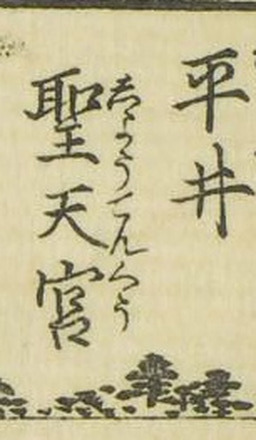聖天宮
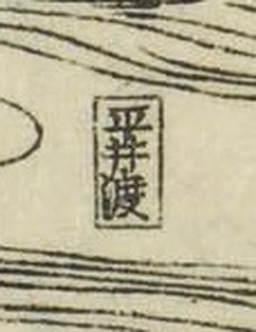平井渡

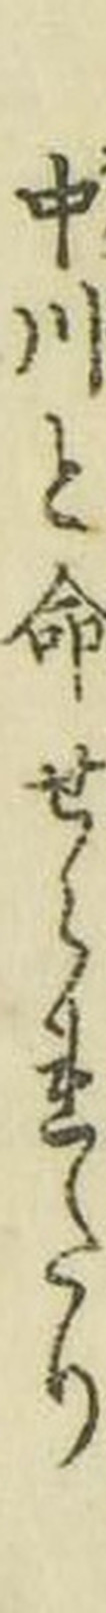中川と命せられたり
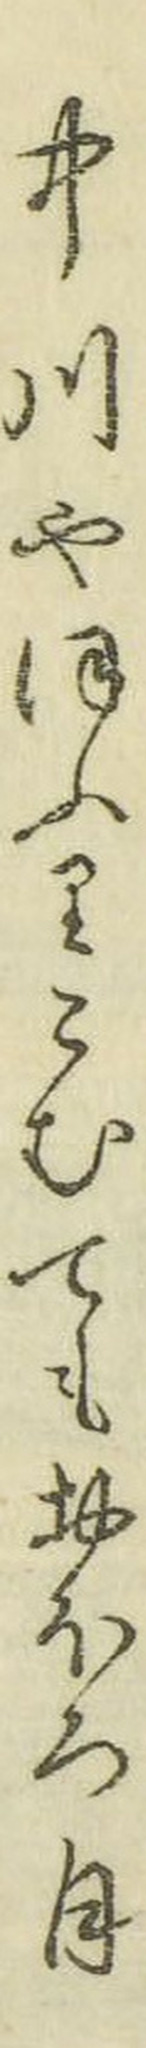中川やほふりこむてもおほろ月嵐雪
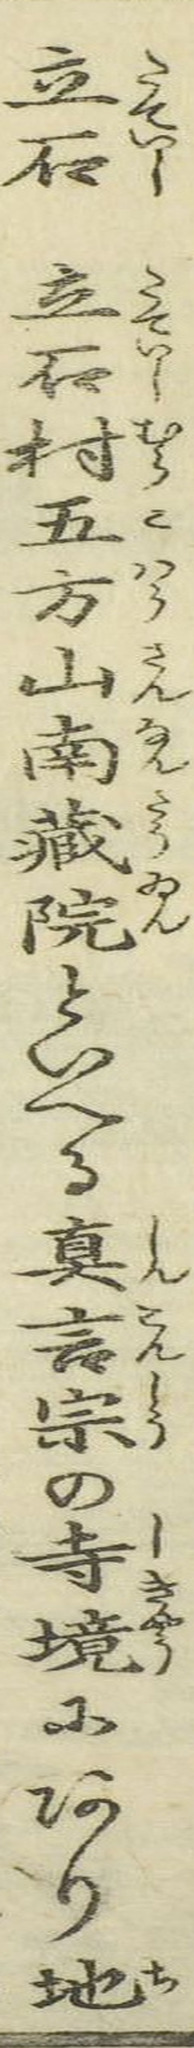立石立石村五方山南蔵院といへる真言宗の寺境にあり地
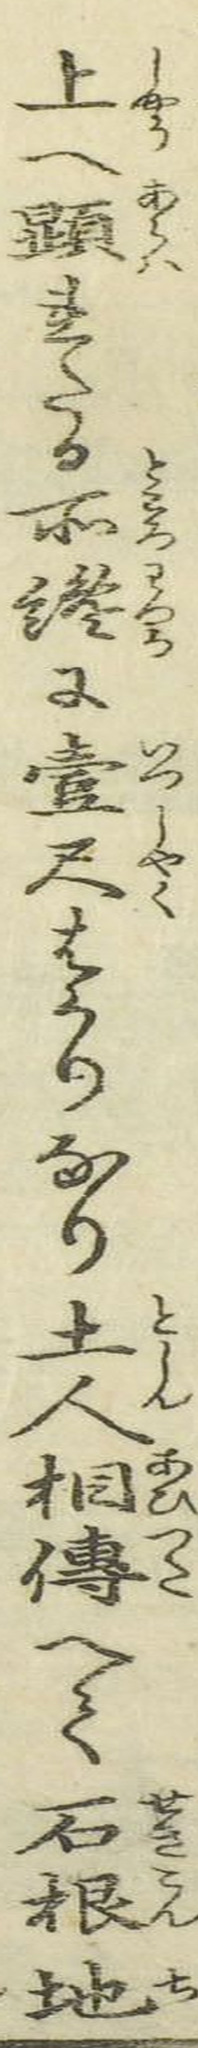上へ顕れたる所纔に壱尺はかりなり土人相伝へて石根地
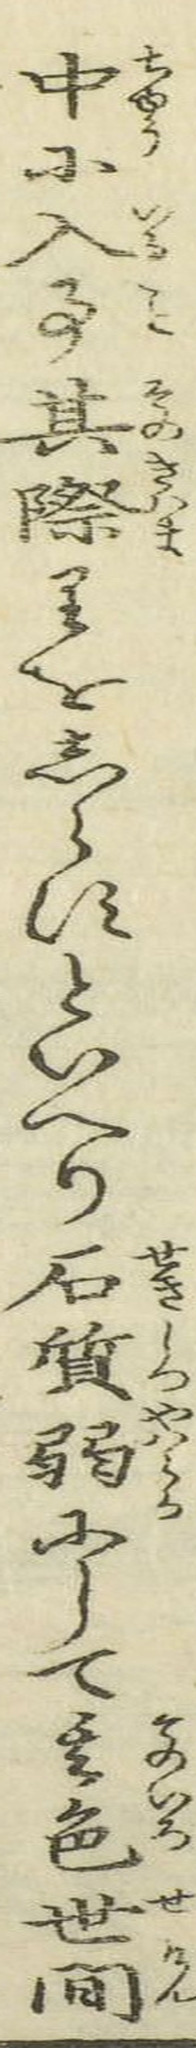中に入事其際りをしらすといへり石質弱にして其色世間
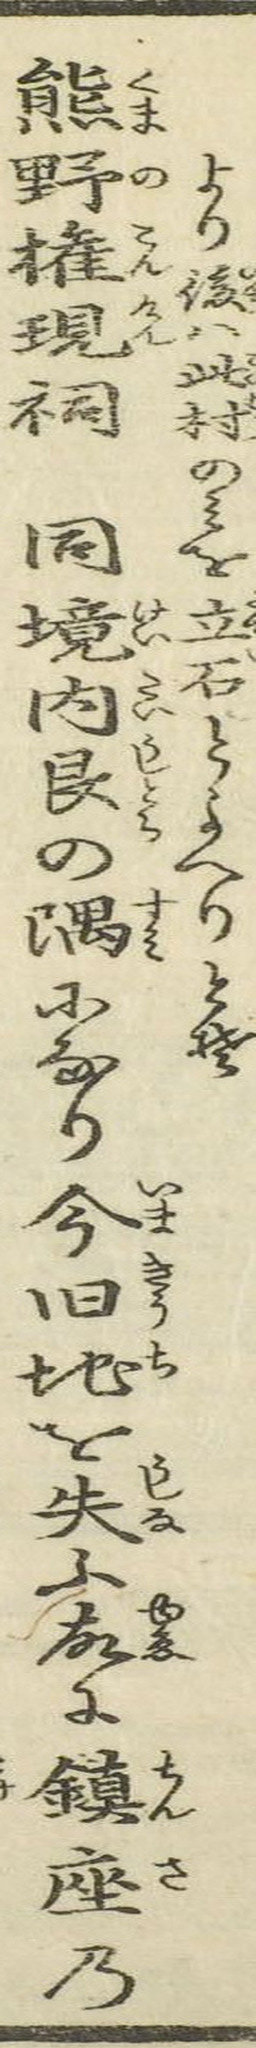熊野権現祠同境内艮の隅になり今旧地を失ふ故に鎮座の
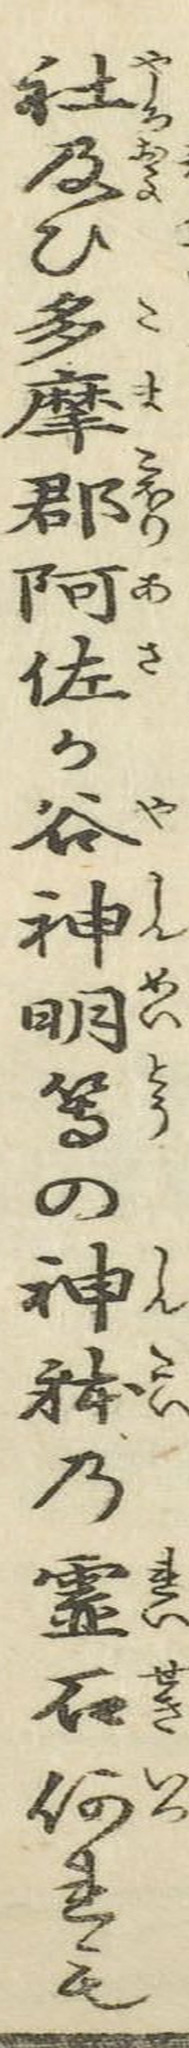社及ひ多摩郡阿佐か谷神明等の神体の零石何れも
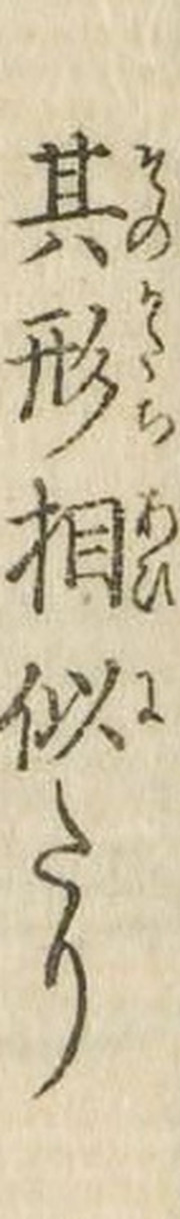其形相似たり
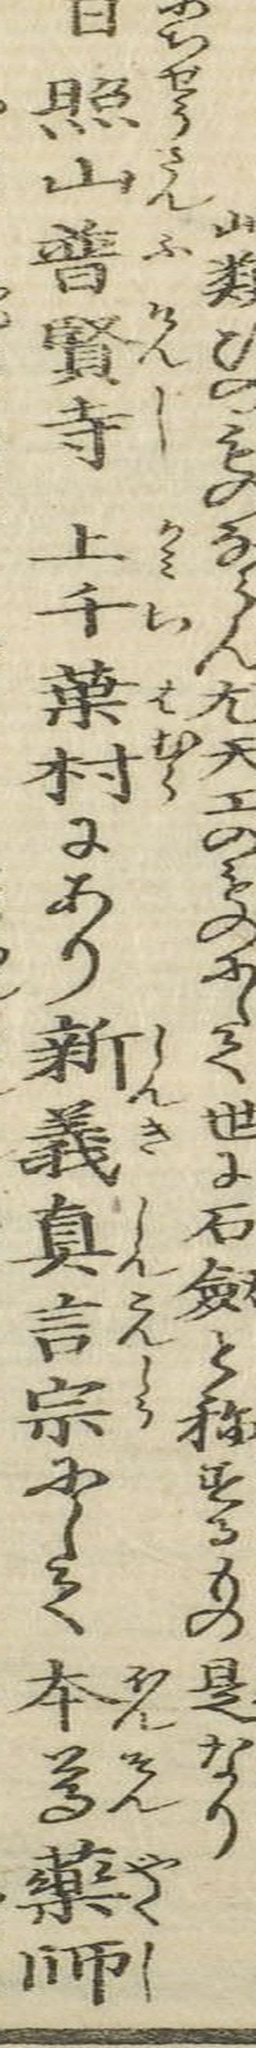日照山普賢寺上千葉村にあり新義真言宗にして本尊薬師
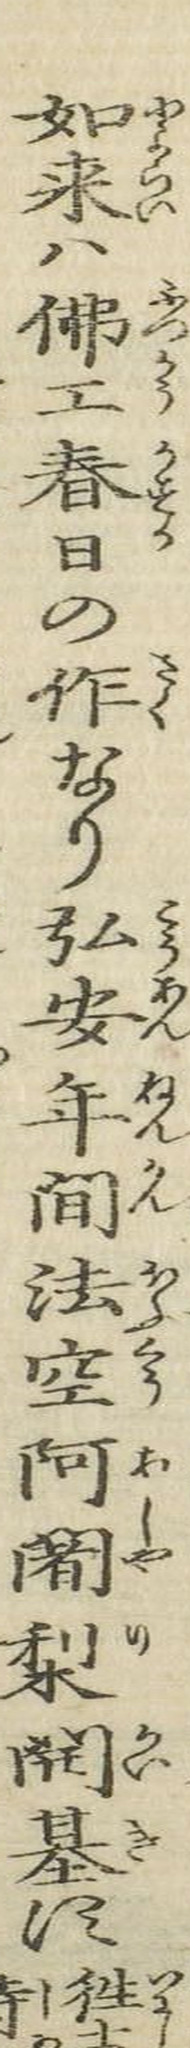如来は仏工春日の作なり弘安年間法空阿闍梨開基す往古は寺院
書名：江戸名所図会 20巻 巻之19
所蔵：東京学芸大学教育コンテンツアーカイブ
